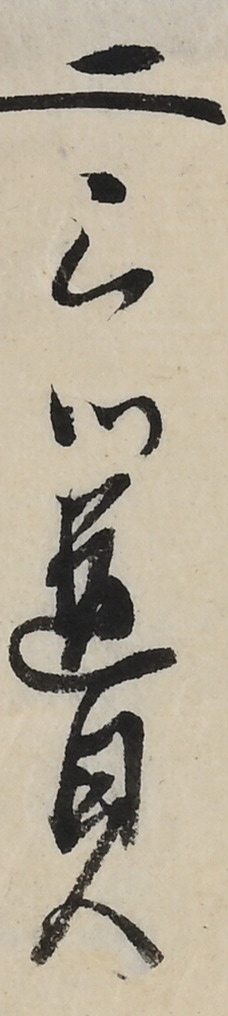一三ツ道具
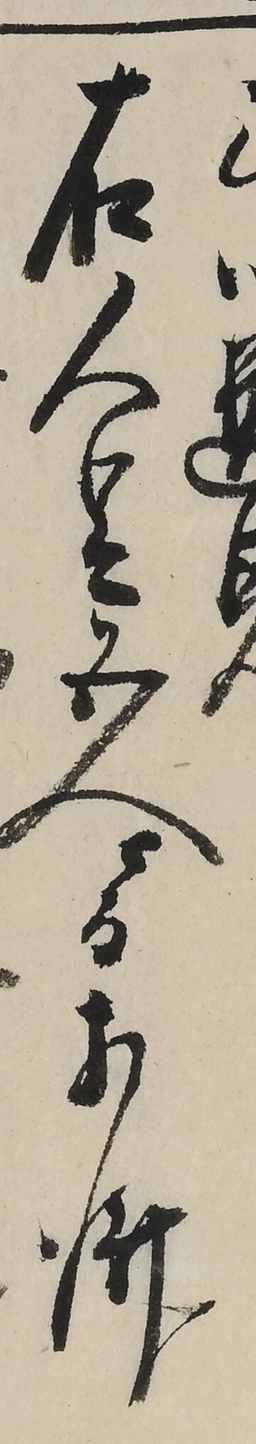一右人足五人二而相済
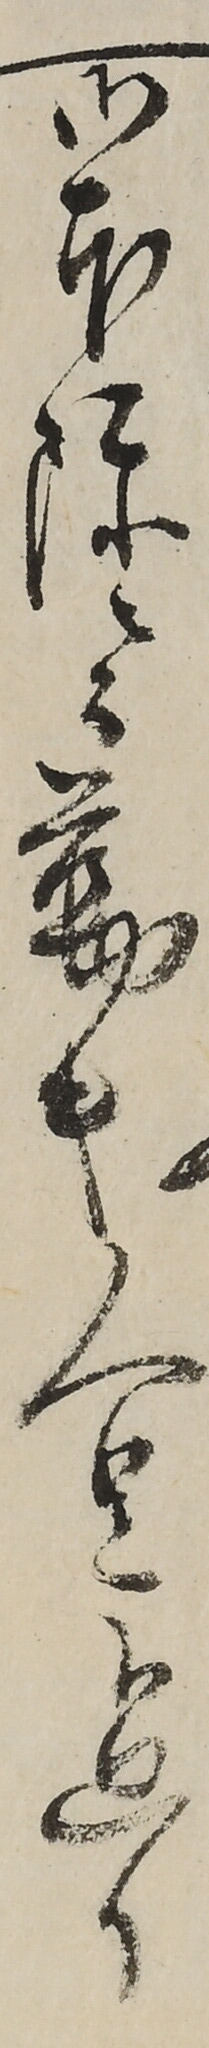御本陣ニ而勤き人足え廻り
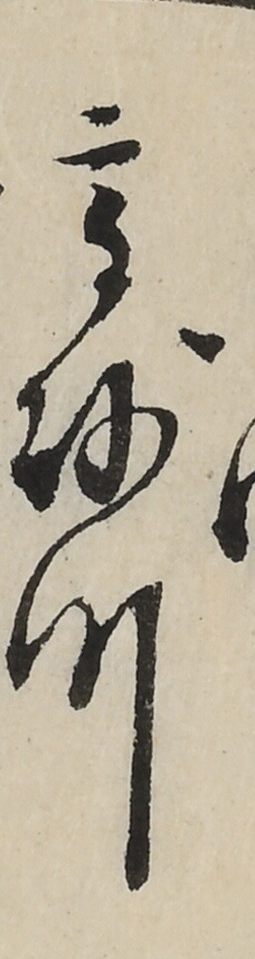高砂町
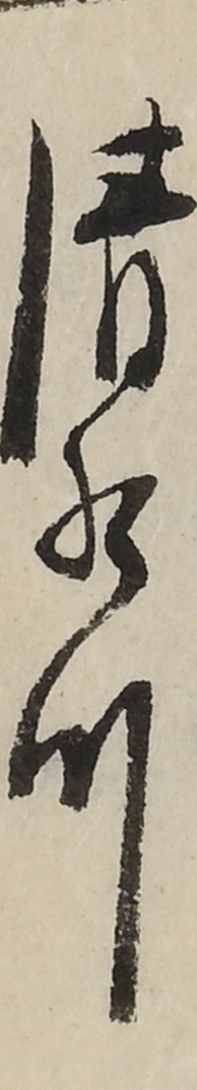清水町
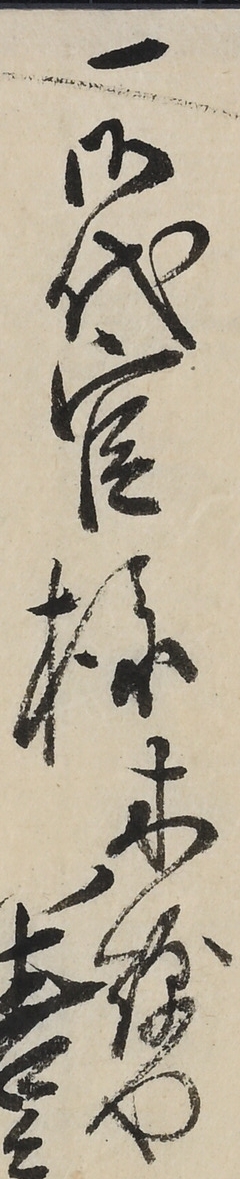一御代官様木綿や
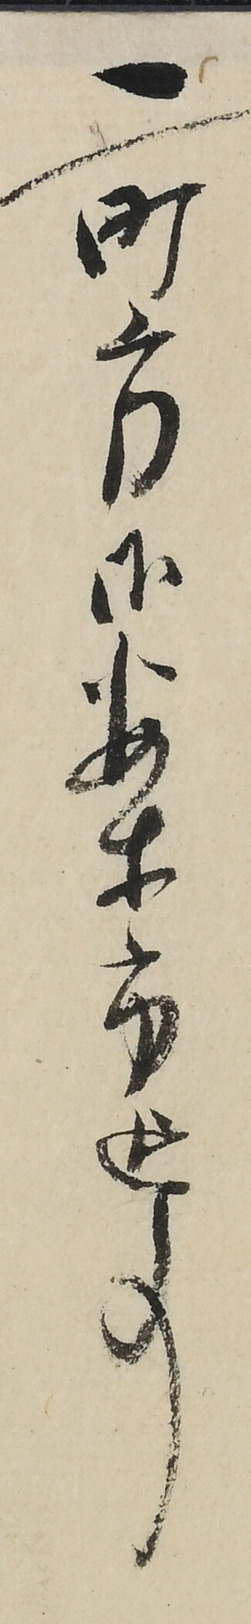一町方御案方廻事
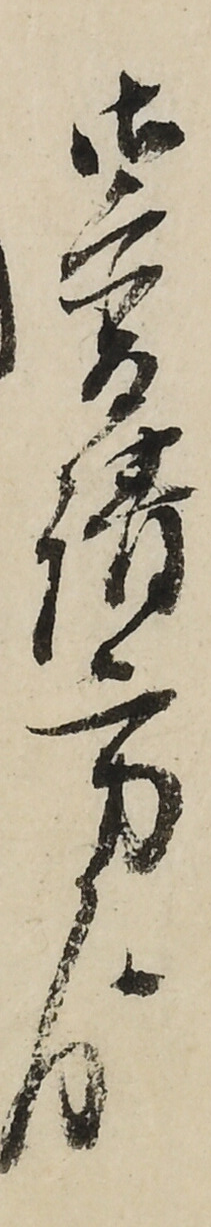御寄請方ゟ
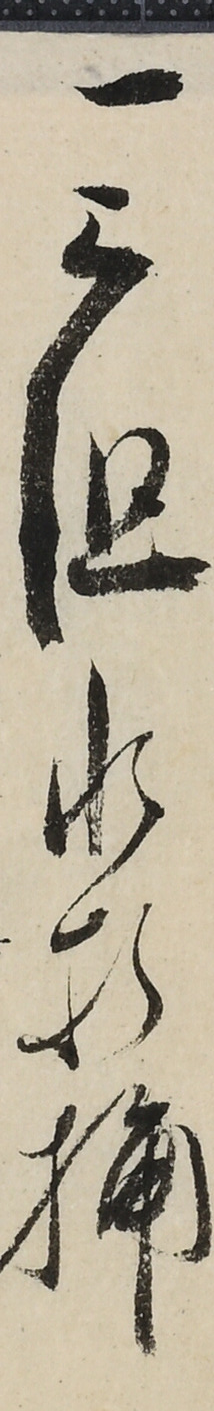一三組水打桶

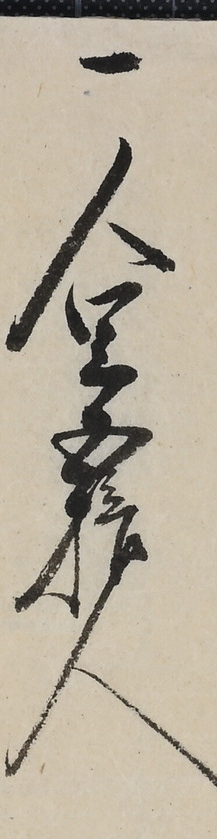一人足五拾人
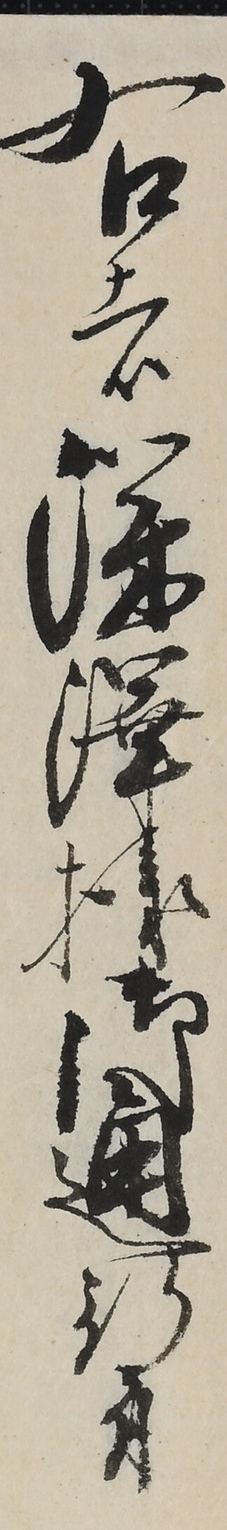右は深沢様御通行ニ付
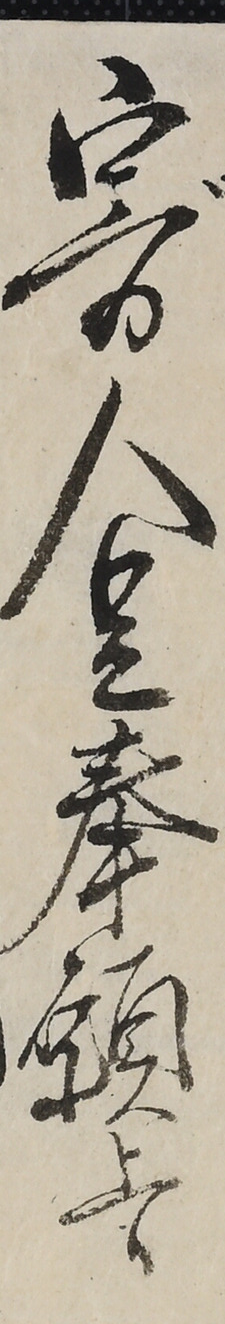寄人足奉願上候
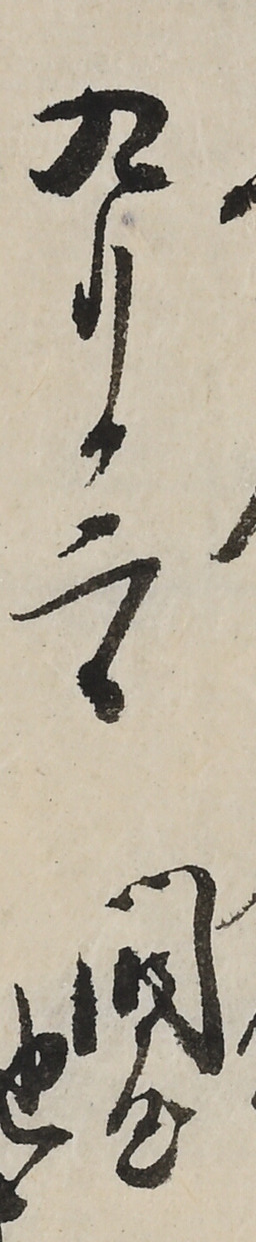九月十二日問屋
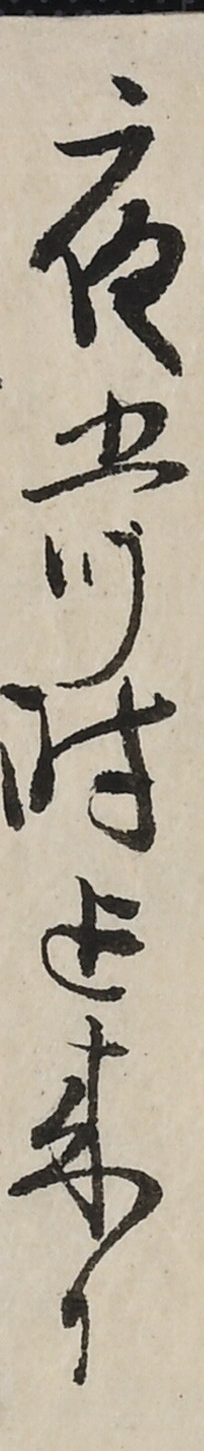夜五ツ時迄来り
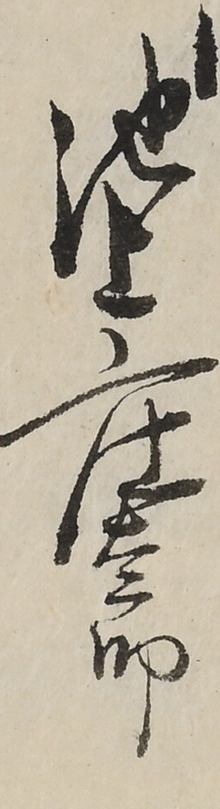池上庄太郎
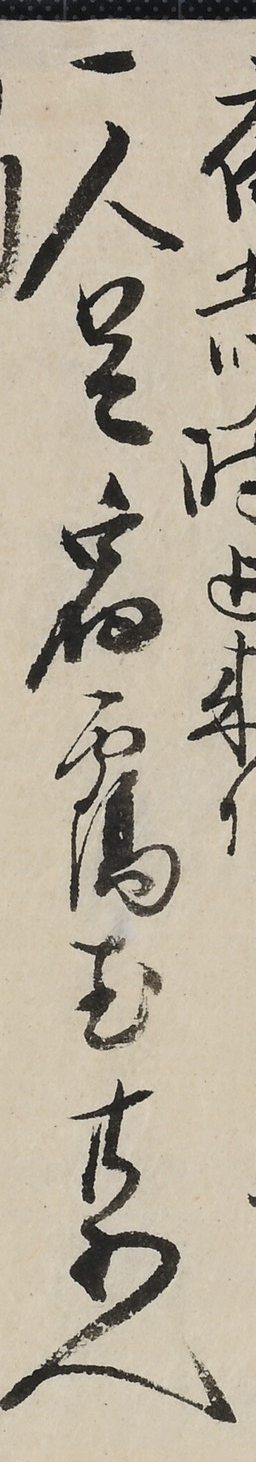一人足宿靏屋廿五人
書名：御巡察様御泊御入用書上帳
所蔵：伊那市立高遠町図書館・合同会社AMANE
